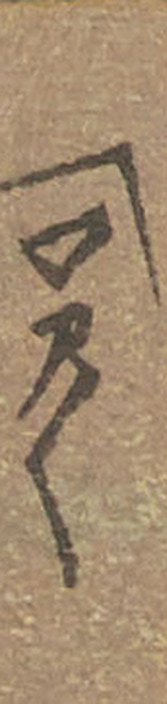「マア〳〵
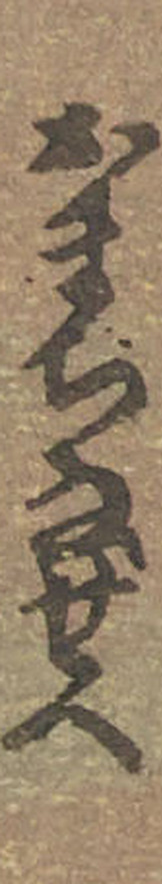おまちなせへ
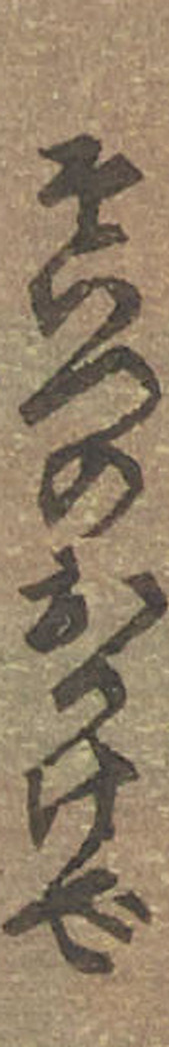そいつのおかけで
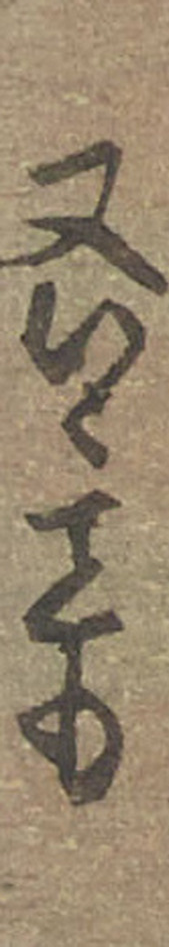又いゝことも
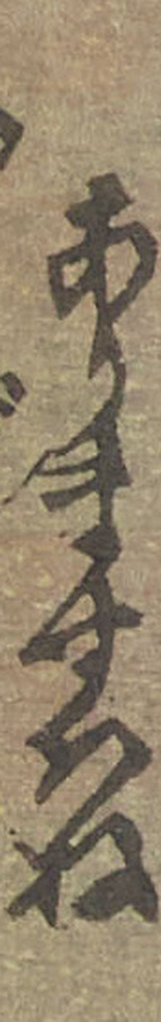ありますはね
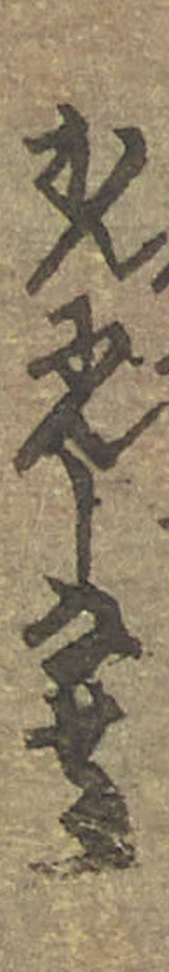かんにんしなせヱ
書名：[鯰仮宅にて打擲されるの図]
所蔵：東京大学総合図書館 General Library in the University of Tokyo, JAPAN
